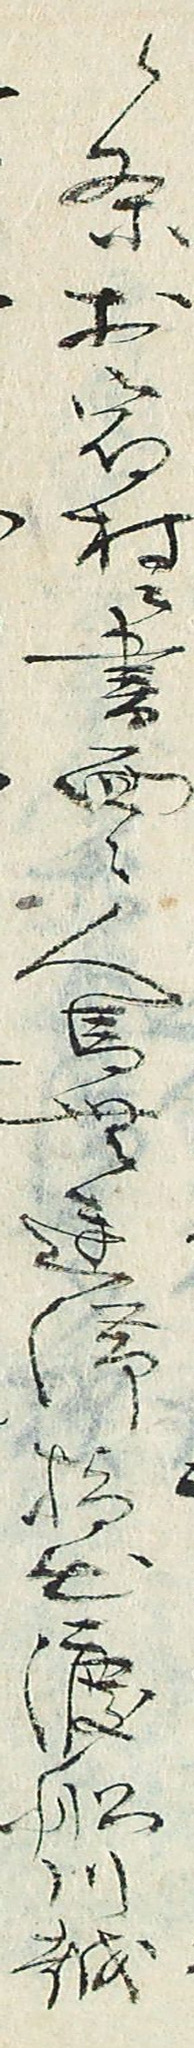候条於宿村に書面之人馬無遅滞指出渡船川越
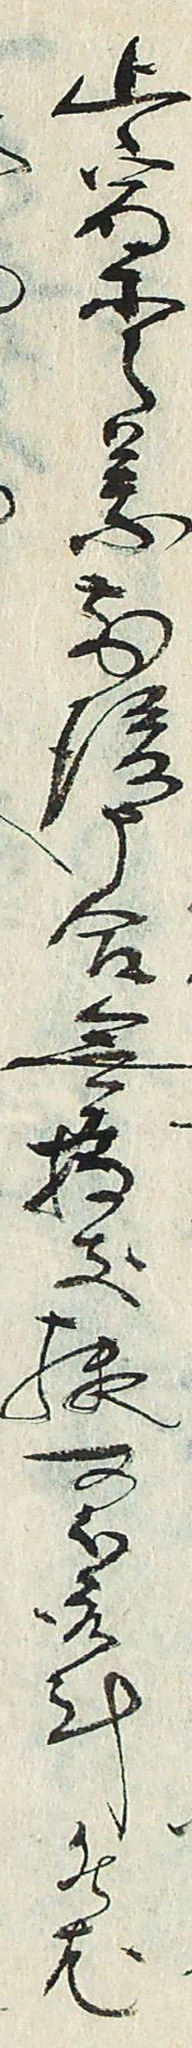止宿等之義前後申合無指支様可被取計候尤
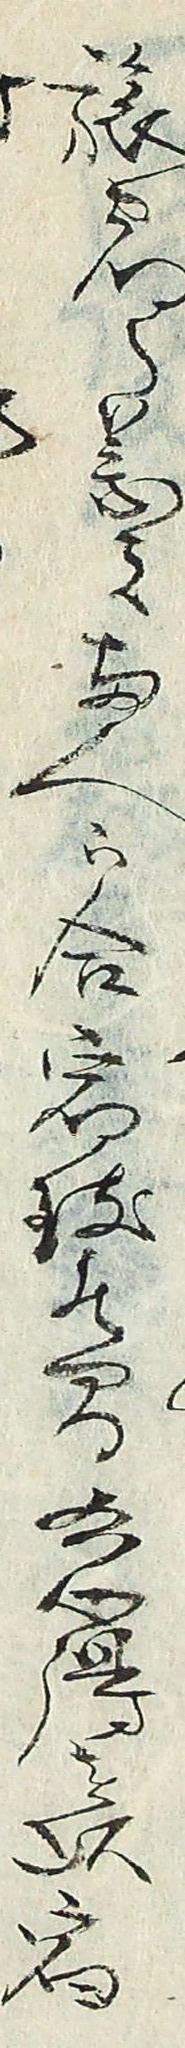旅宿之義は両人被合宿致候間右心得を以宿
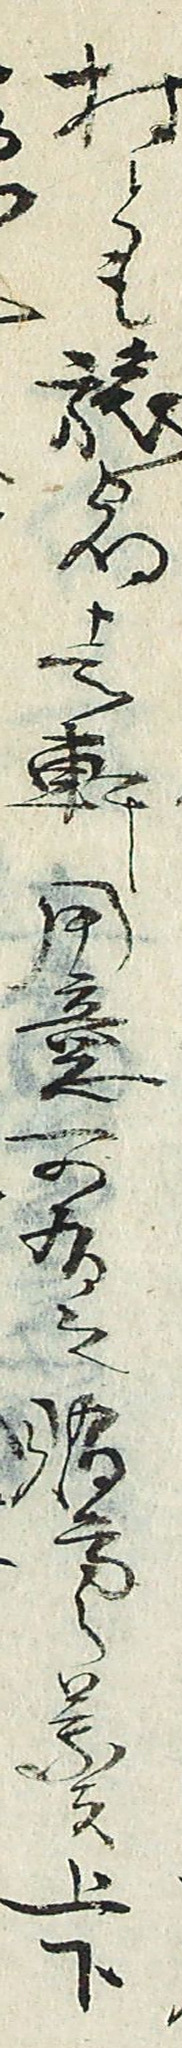村とも旅宿壱軒用意可有之賄方之義は上下
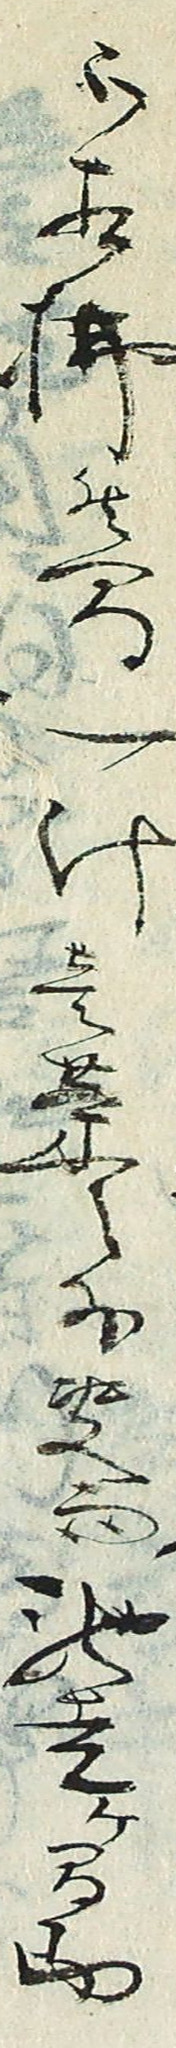被相払候間一汁壱菜之外決て馳走ヶ間布
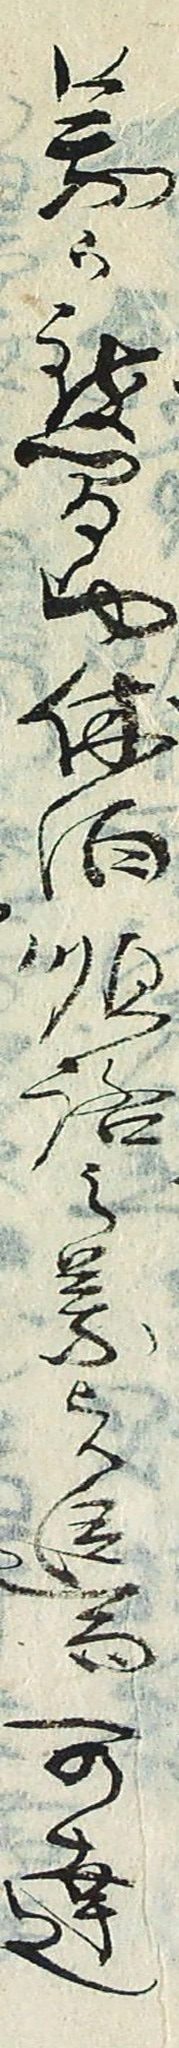義被致間布休泊順路之義は追て可達
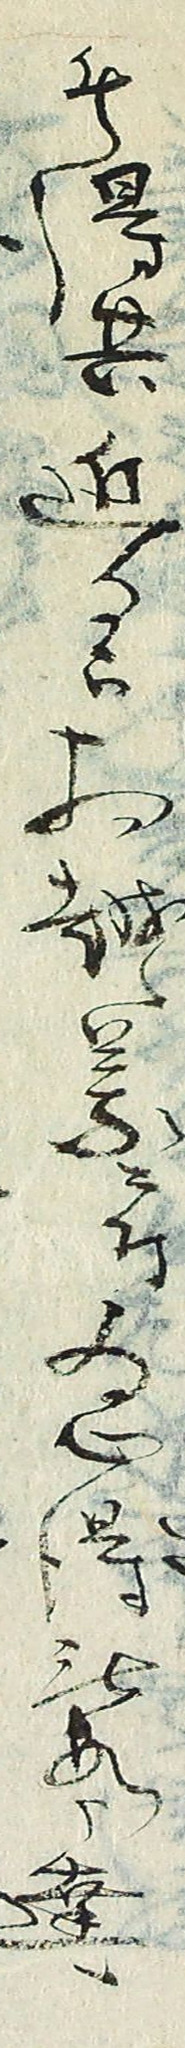候得共近日被相越候義に付為心得此段申達候
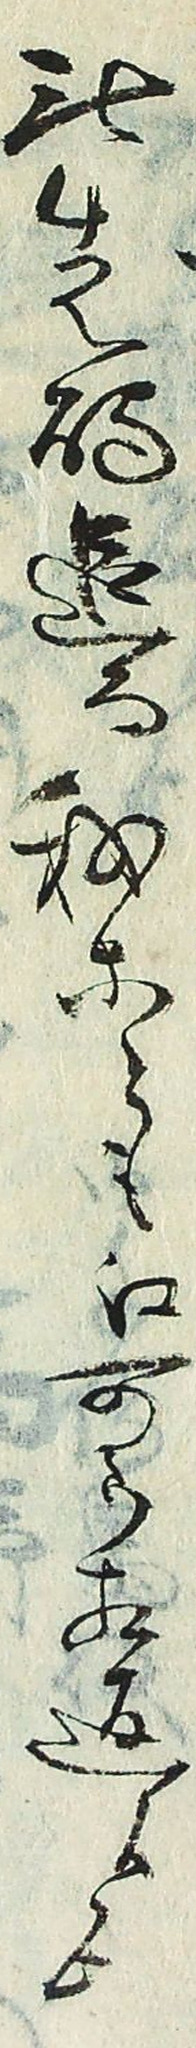此先触追て我等ともえ可被相返候以上
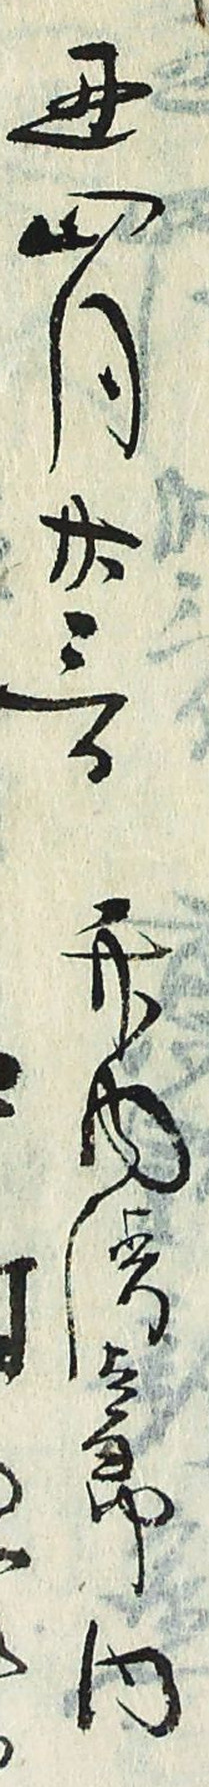丑四月廿三日竹内清太郎内
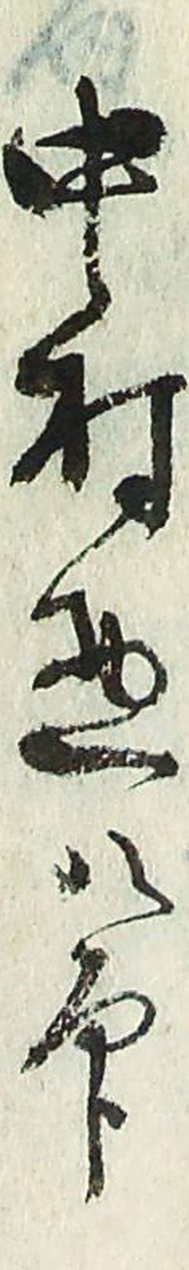中村惣八印
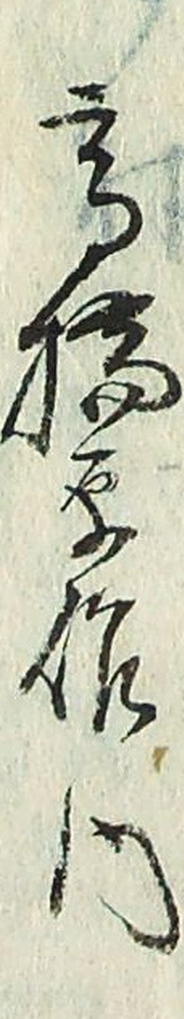高橋平作内
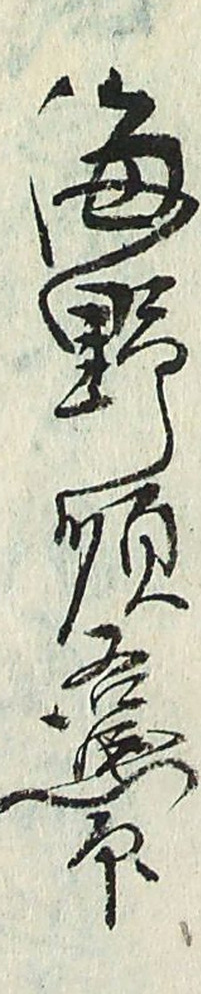海野順右衛門印
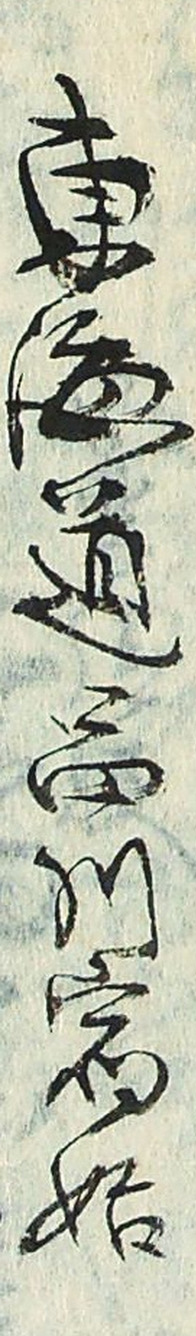東海道品川宿始
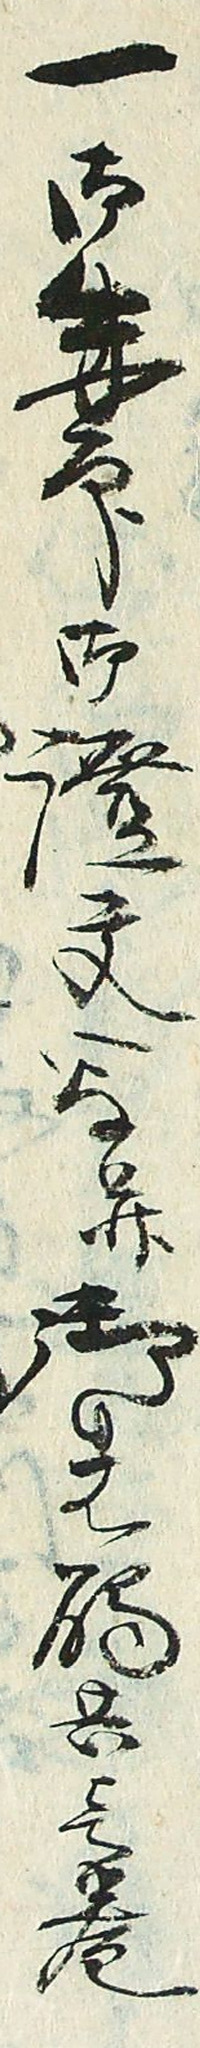一御朱印御証文写并御先触共壱巻
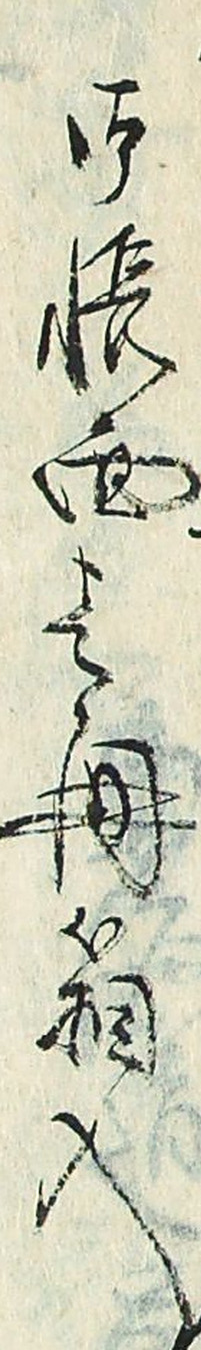御帳面壱冊箱入

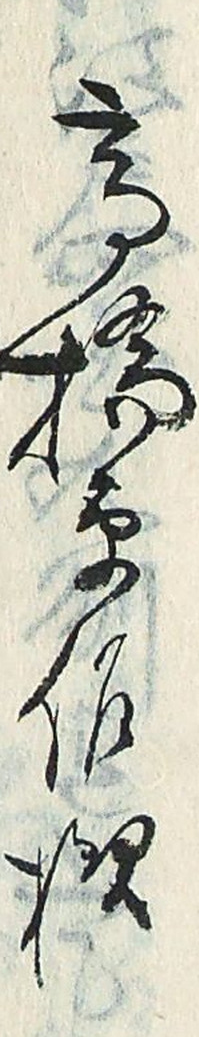高橋平作様
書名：公辺御役人為御廻浦御立越諸御用一巻
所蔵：鳴門教育大学 Naruto University of Education
